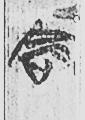命
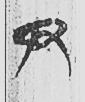尹
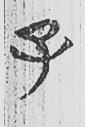子
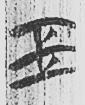玉
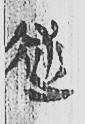述
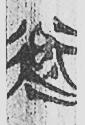{行幺止}
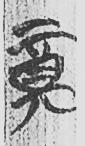奠
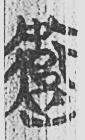{衛止}
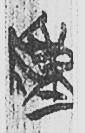陳
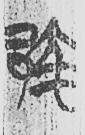○（蔡）
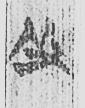及
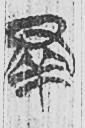群
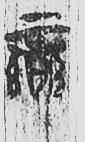{絲言}
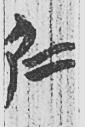𡰥
